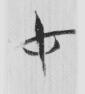才
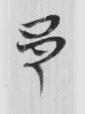邑
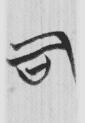司
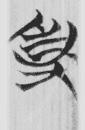事
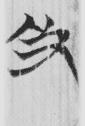及
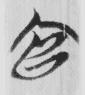官
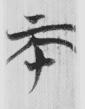帀
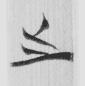之
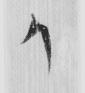人
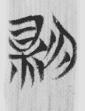則
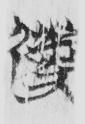發
